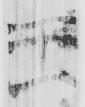王
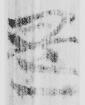是
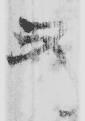又
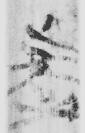{之室}
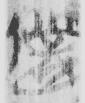{人菐臣}
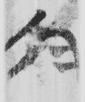今
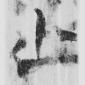少
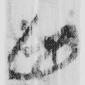臣
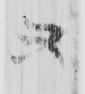又
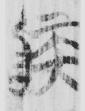疾
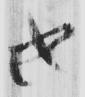女
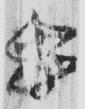思
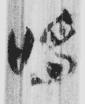{口爪勺}
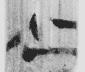少
